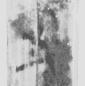之
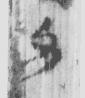力
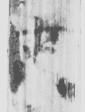才
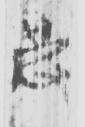皮
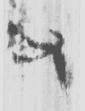又
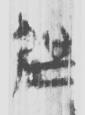{弓口二}
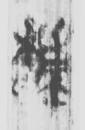{木甫}
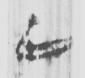㠯（以）
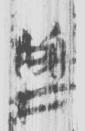爲
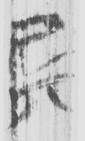{己亓}
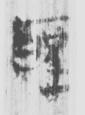聖
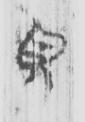{目人}
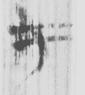于
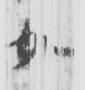外
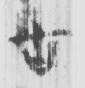古
